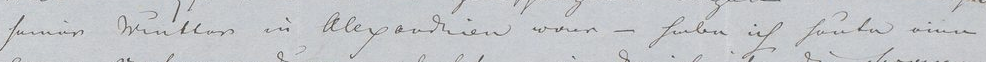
seiner Mutter in Alexandrien war, habe ich heute eine
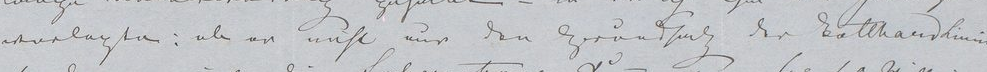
vorlegte: ob er nicht nur den Grundsatz der Gotthard Linie
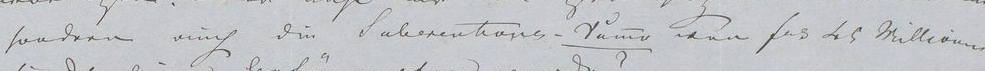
sondern auch die Subventions-Summe von frs 45 Millionen
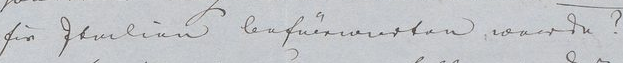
für Italien befürworten werde?
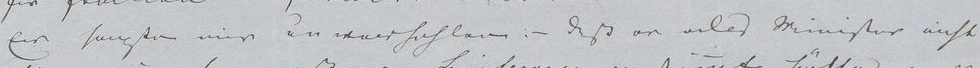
Er sagte mir unverhohlen: daß er als Minister nicht
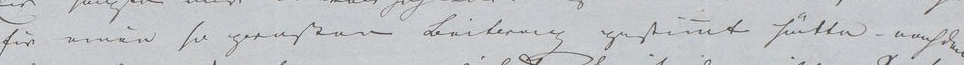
für einen so großen Beitrag gestimmt hätte, nachdem
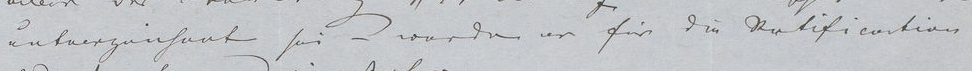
unterzeichnet sei, werde er für die Ratification
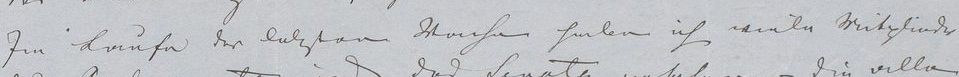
Im Laufe der letzten Woche habe ich viele Mitglieder
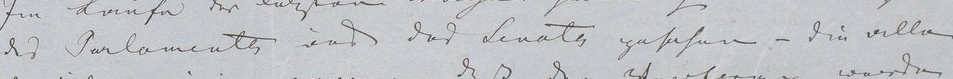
des Parlaments und des Senats gesehen, die alle
